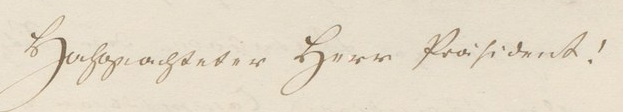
Hochgeachteter Herr Präsident!
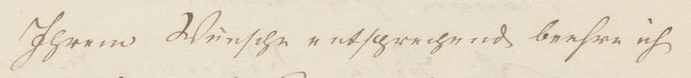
Ihrem Wunsche entsprechend beehre ich
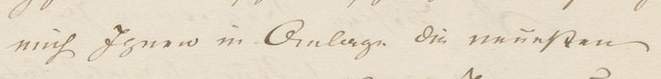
mich Ihnen in Anlage die neuesten
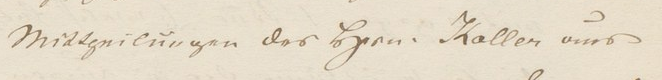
Mittheilungen des Hrrn. Koller aus
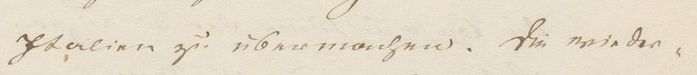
Italien zu übermachen. Die wieder-
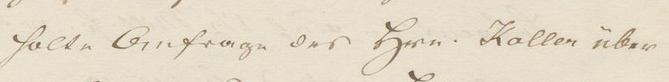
holte Anfrage des Hrn. Koller über
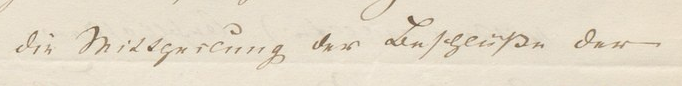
die Mittheilung des Beschlußes der
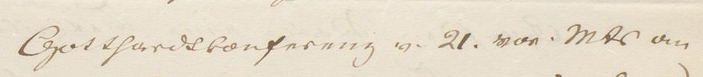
Gotthardtkonferenz v. 21.vor. Mts an
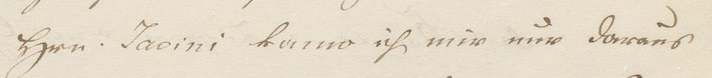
Hrrn. Jacini kann ich mir nur daraus
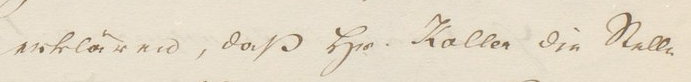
erklären, daß Hr. Koller die Stelle
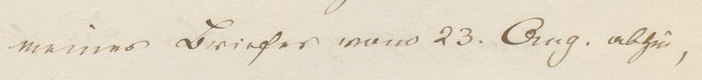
meines Briefes vom 23. Aug. abhin,
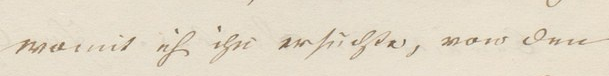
womit ich ihn ersuchte, von den
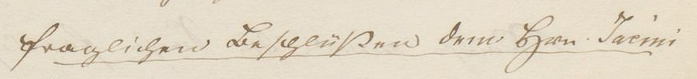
fraglichen Beschlüßen den Hrn. Jacini
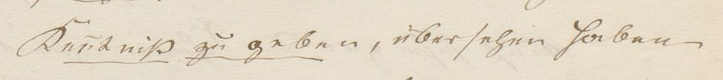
Kenntniß zu geben, übersehen haben
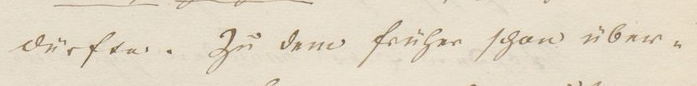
dürfte. Zu dem früher schon über-
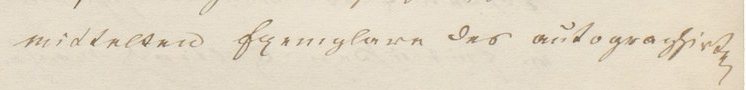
mittelten Exemplaren des autographirten
